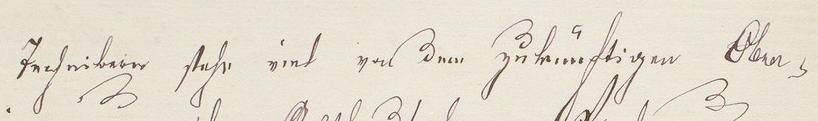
Technikern sehr viel von dem zukünftigen Ober-
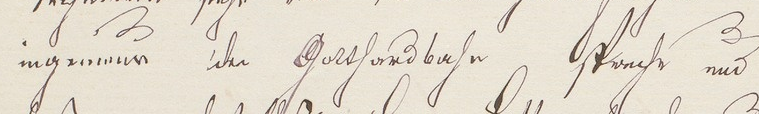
ingenieur der Gotthardbahn spreche und
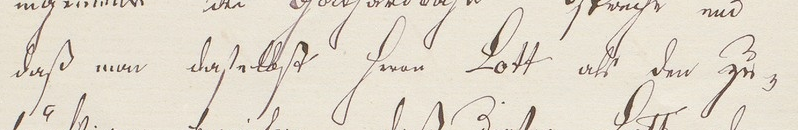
daß man daselbst Herrn Lott als den zu-
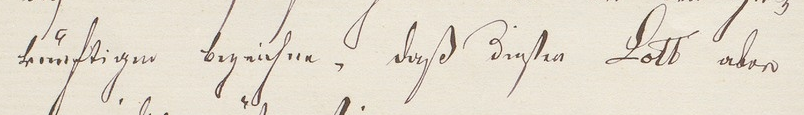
künftigen bezeichne. Daß dieser Lott aber
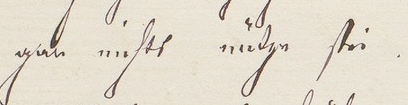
gar nichts nütze sei.
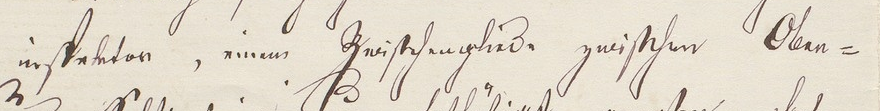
inspektor, einem Zwischengliede zwischen Ober-
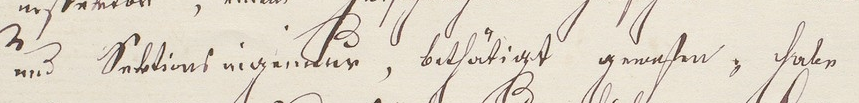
und Sektionsingenieur, bethätigt gewesen; habe
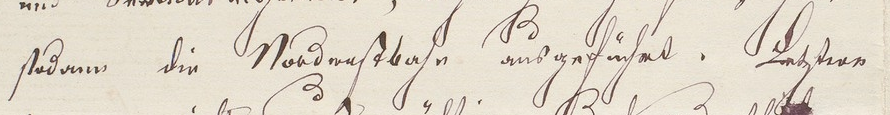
sodann die Nordwestbahn ausgeführt. Letztere
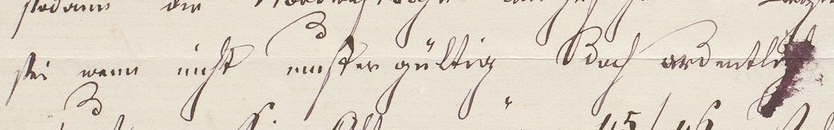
sei wenn nicht mustergültig doch ordentlich
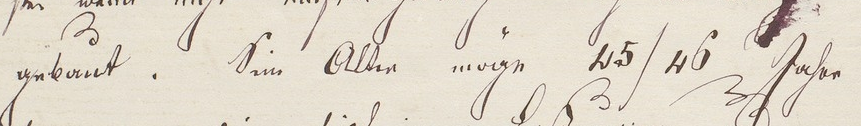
gebaut. Sein Alter möge 45/46 Jahre
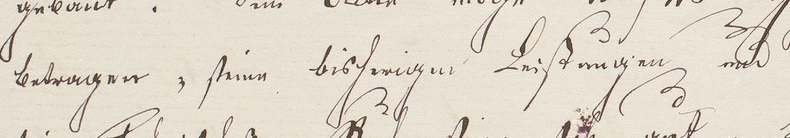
betragen, seine bisherigen Leistungen und
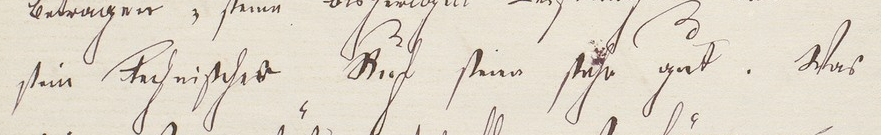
sein technischer Ruf seien sehr gut. Was
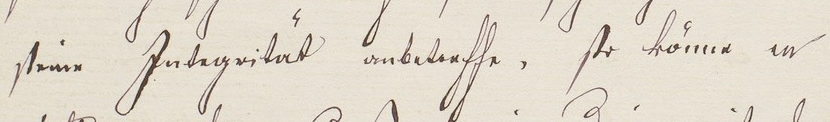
seine Integrität anbetreffe, so könne er
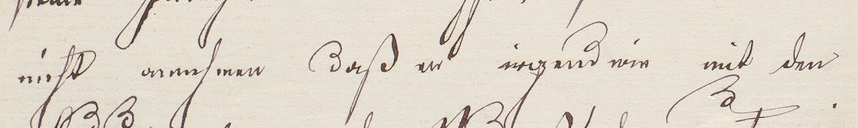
nicht annehmen daß er irgend wie mit den
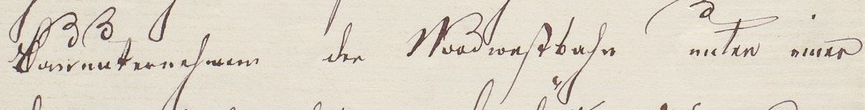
Bauunternehmern der Nordwestbahn unter einer
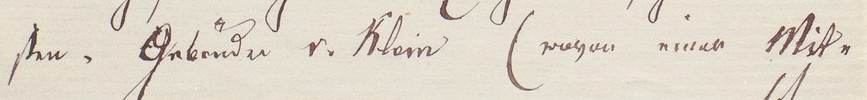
sen, Gebrüder v. Klein (wovon einer Mit-
